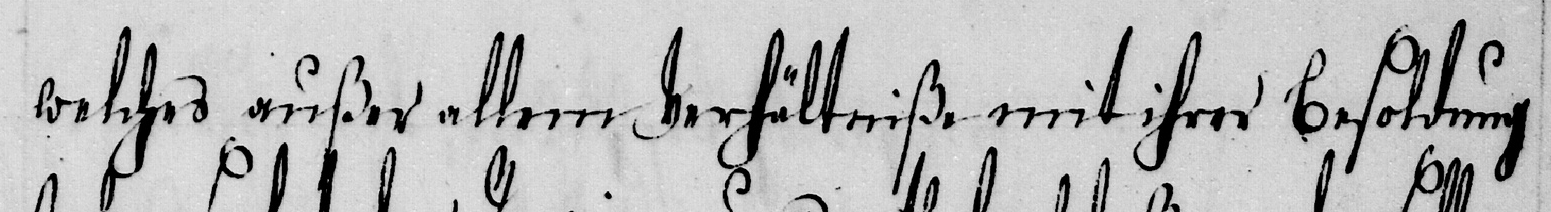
welches außer allem Verhältniße mit ihrer Besoldung
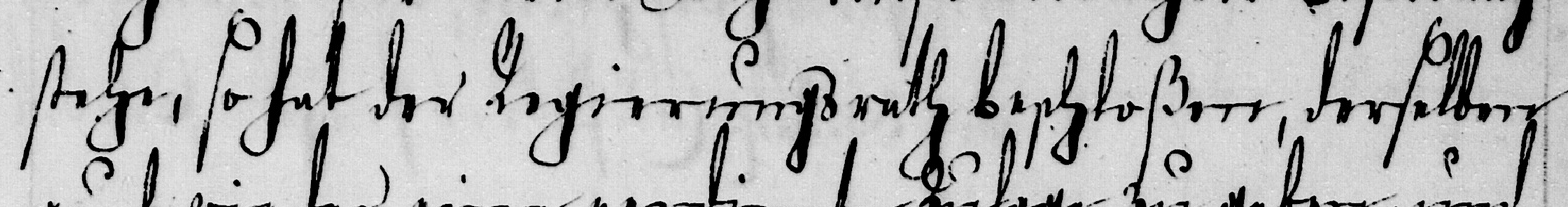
e, so hat der Regierungsrath beschloßen, derselben
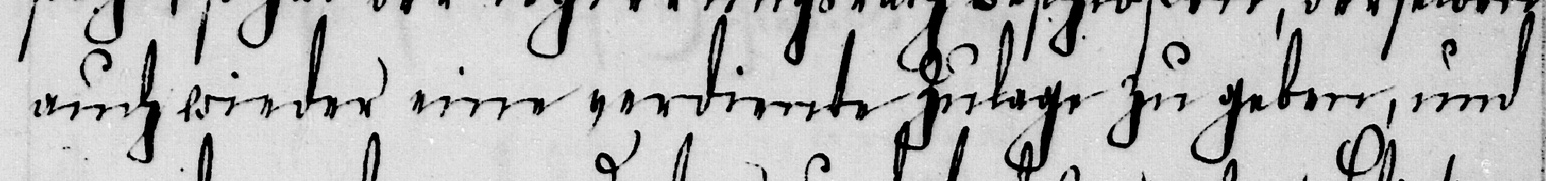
auch wieder eine verdiente Zulage zu geben, und
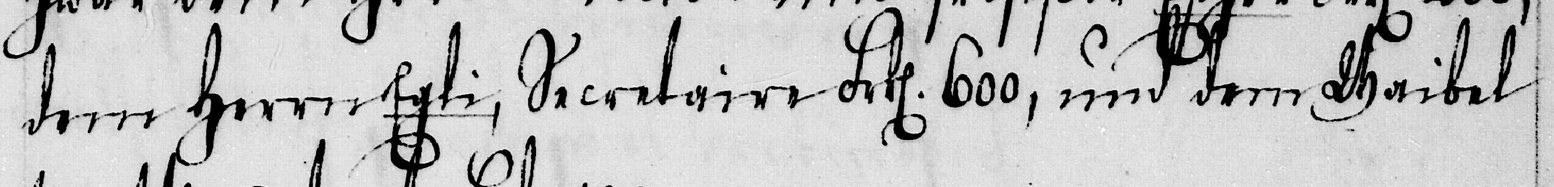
dem Herrn Egli, Secretaire Frk[en]. 600, und dem Waibel
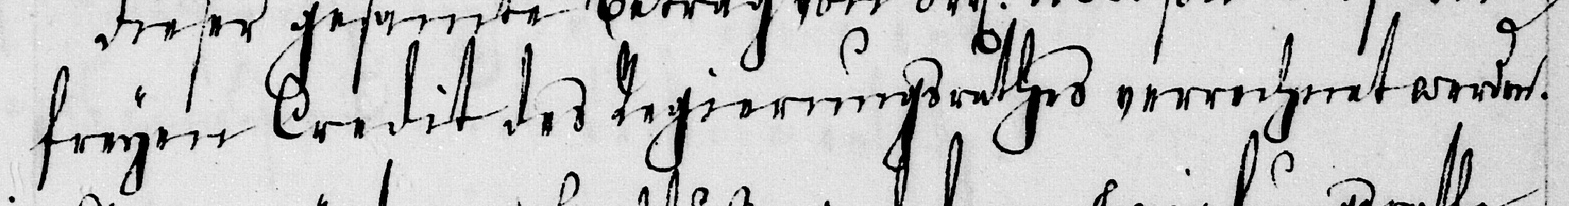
freyen Credit des Regierungsrathes verrechnet werden.
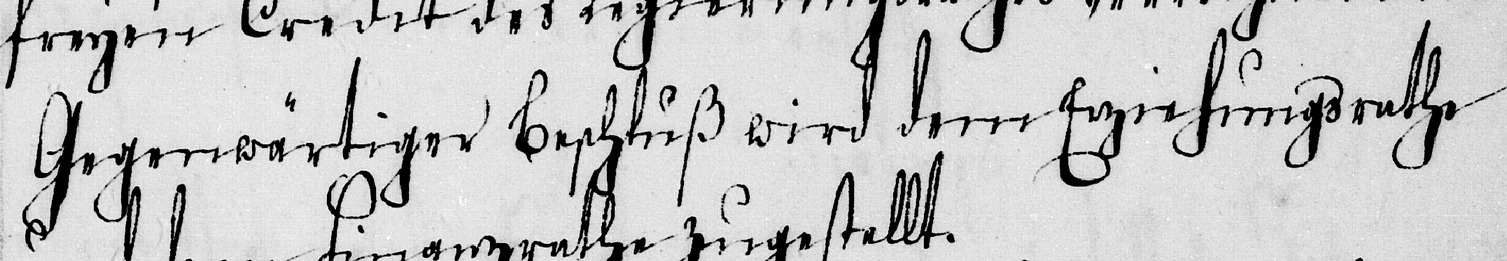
Gegenwärtiger Beschluß wird dem Erziehungsrathe
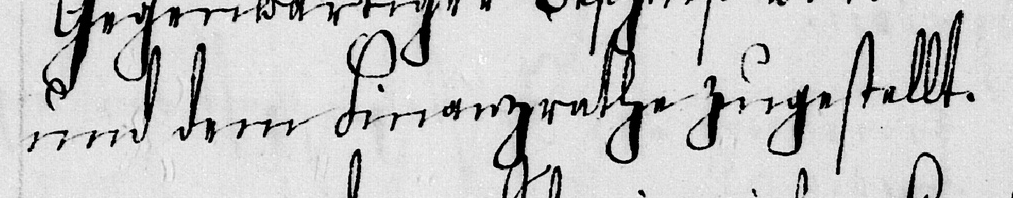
und dem Finanzrathe zugestellt.
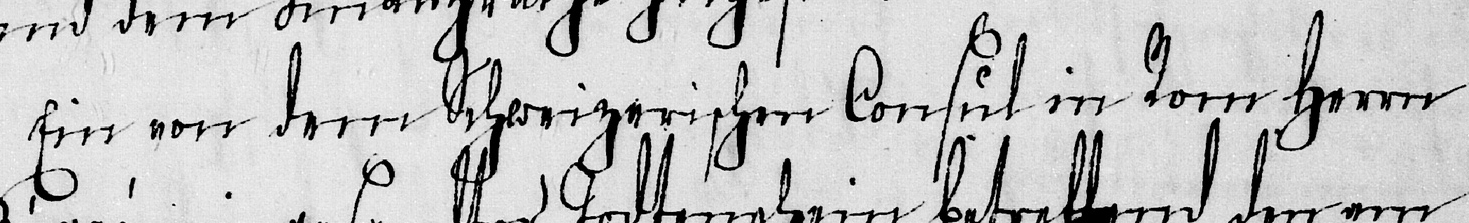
Ein von dem Schweizerischen Consul in Rom Herrn
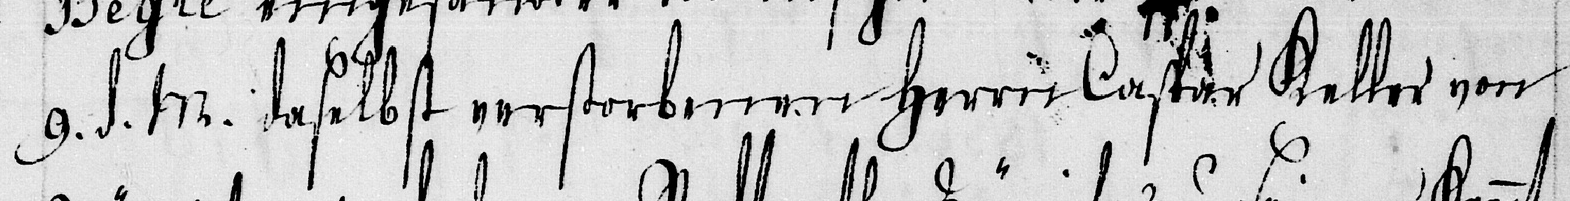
9. d. M. daselbst verstorbenen Herrn Caspar Keller von
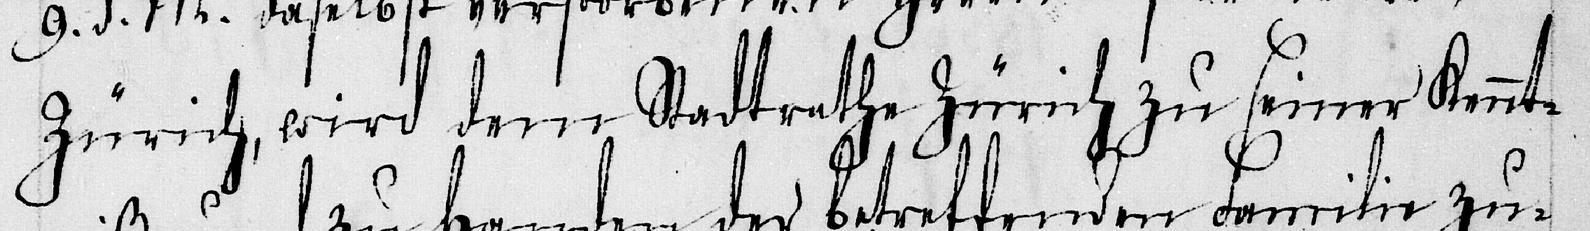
Zürich, wird dem Stadtrathe Zürich zu seiner Kennt¬
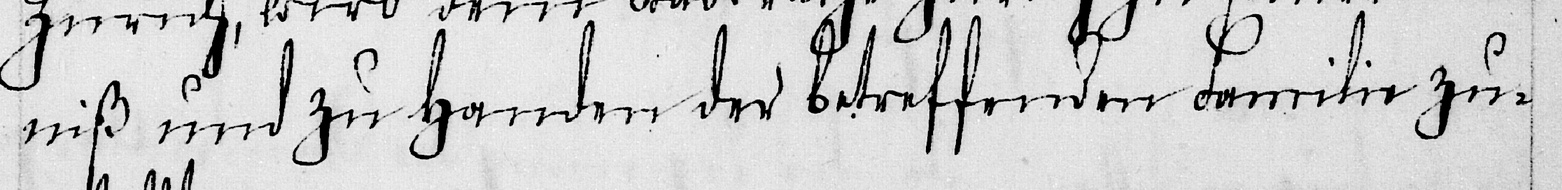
niß und zu Handen der betreffenden Familie zug¬
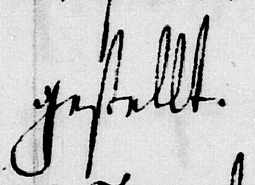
estell¬
